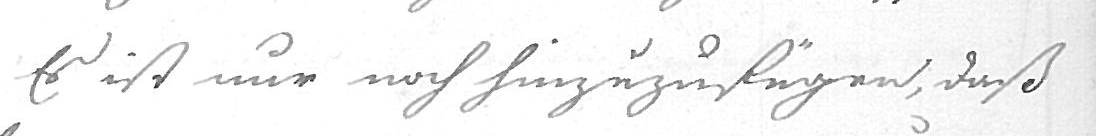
Es ist nur noch hinzuzufügen, daß
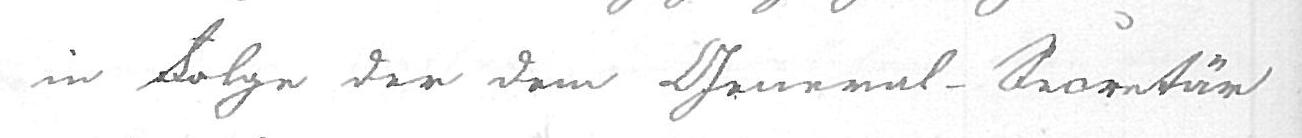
in Folge der dem General-Secretär
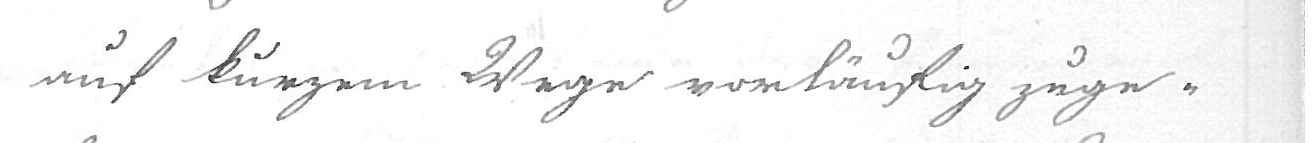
auf kurzem Wege vorläufig zuge-
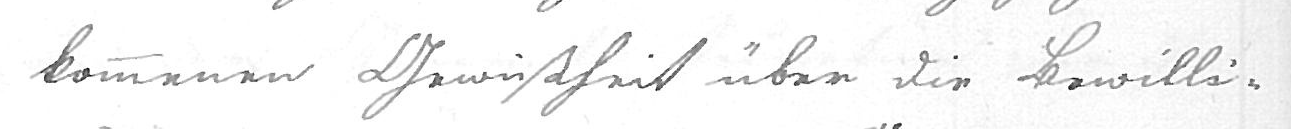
kommenen Gewißheit über die Bewilli-
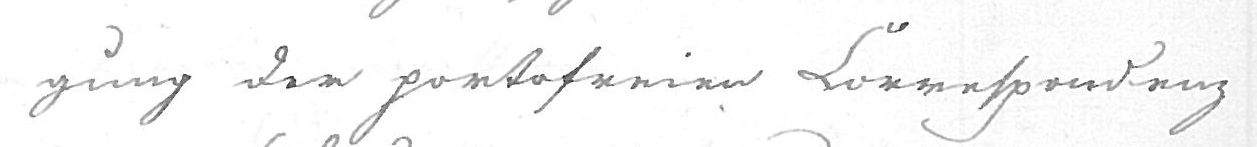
gung der portofreien Correspondenz
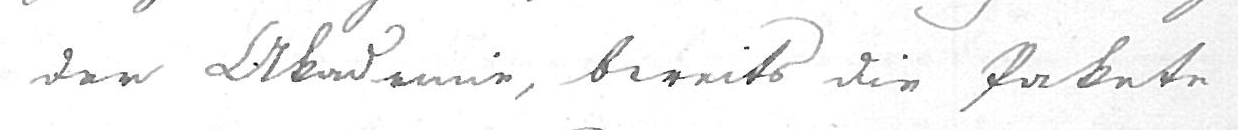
der Akademie, bereits die Pakete
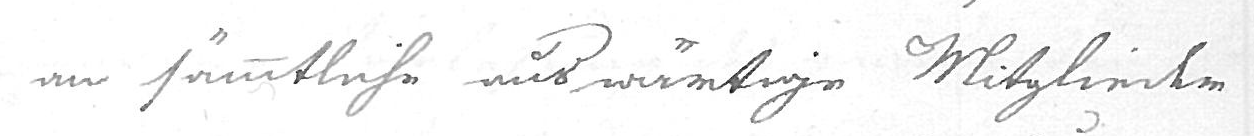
an sämmtliche auswärtige Mitglieder
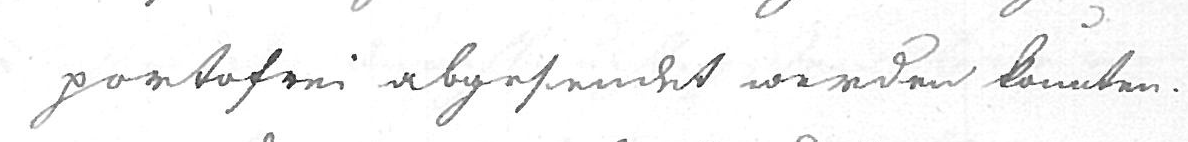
portofrei abgesendet werden konnten.
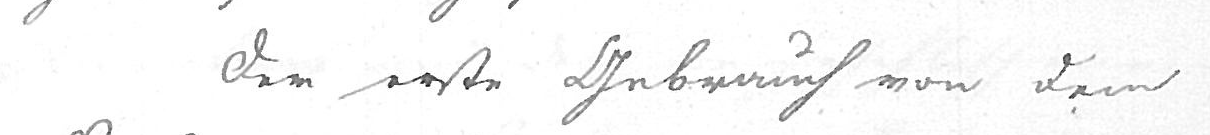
Der erste Gebrauch von dem
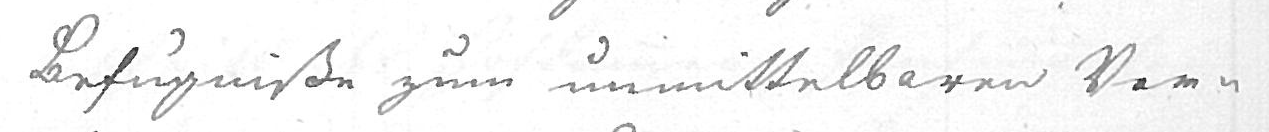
Befugniße zum unmittelbaren Ver-
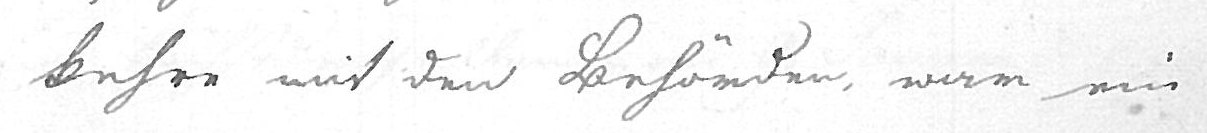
kehr mit den Behörden, war ein
